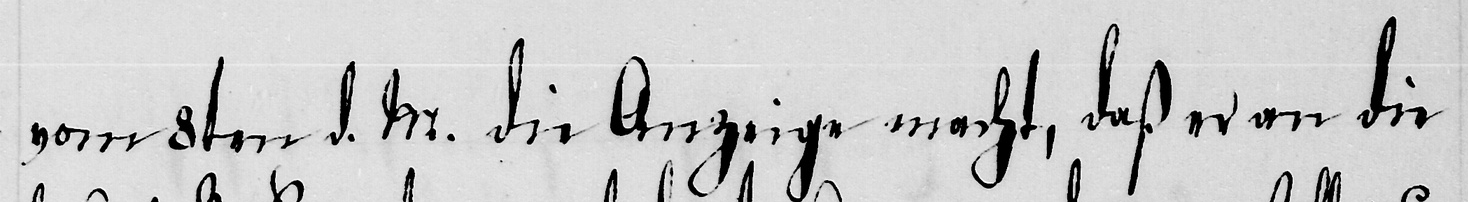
vom 8ten d. M. die Anzeige macht, daß er an die
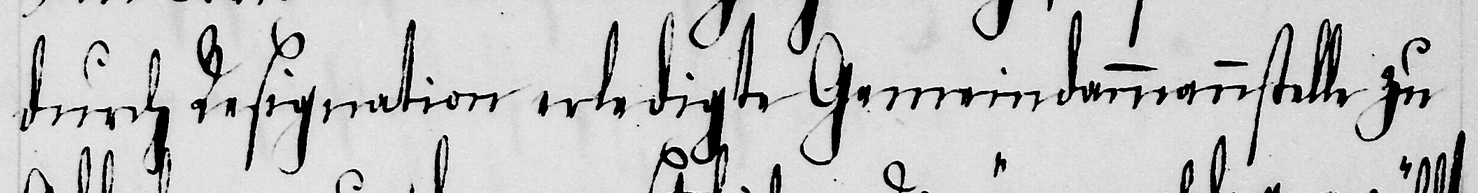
durch Resignation erledigte Gemeindammannstelle zu
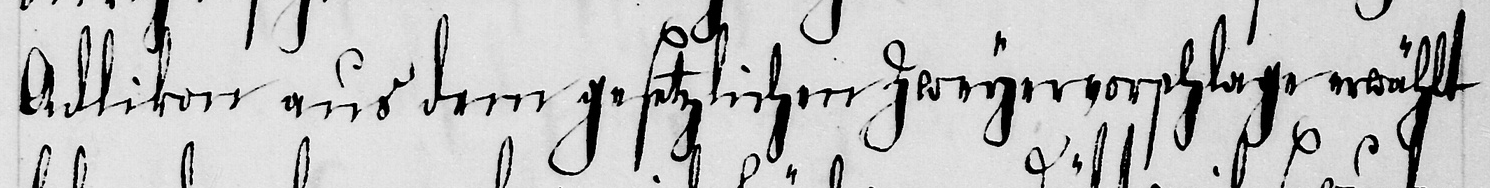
Adlikon aus dem gesetzlichen Zweyervorschlage erwählt
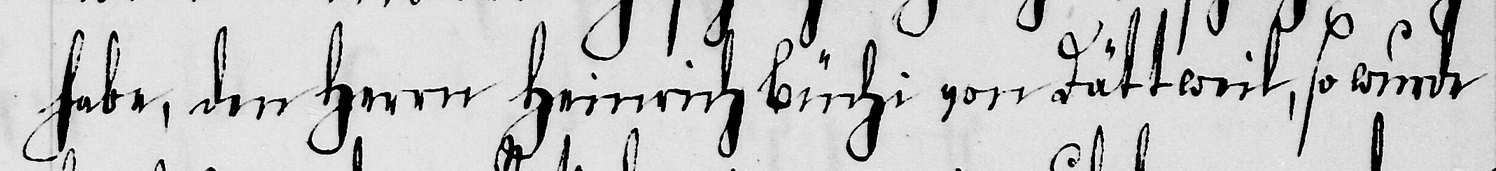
habe, den Herrn Heinrich Büchi von Dättweil, so wurde
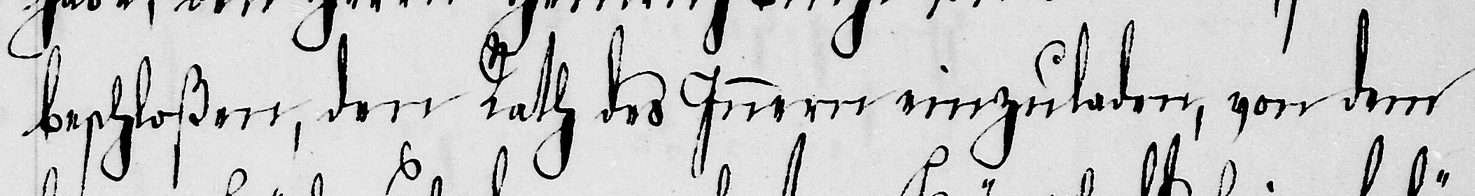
beschloßen, den Rath des Innern einzuladen, von dem
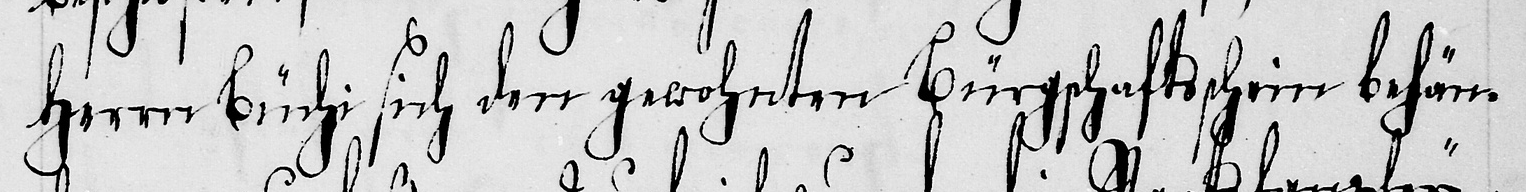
Herrn Büchi sich den gewohnten Bürgschaftsschein behän¬
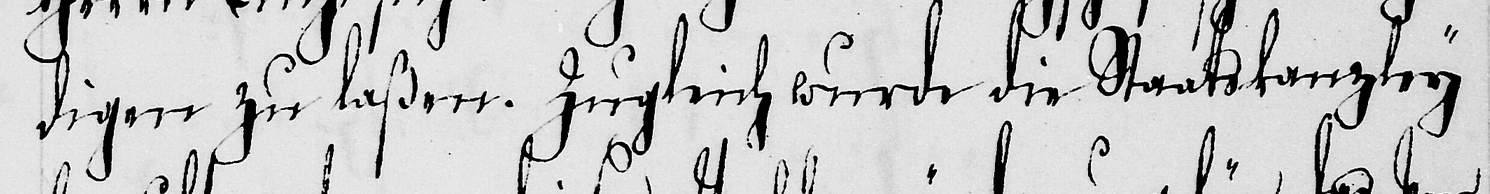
digen zu laßen. Zugleich wurde die Staatskanzley
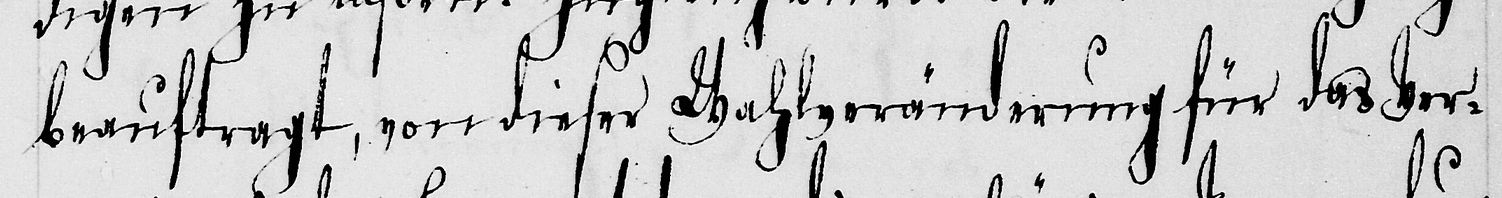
beauftragt, von dieser Wahlveränderung für das Ver¬
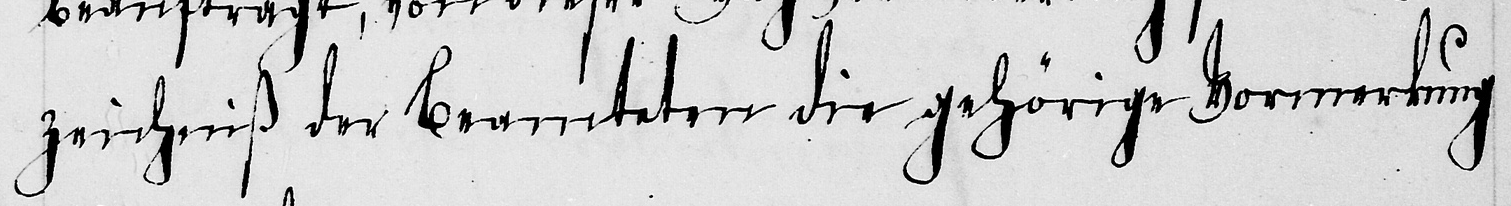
zeichniß der Beamteten die gehörige Vormerkung
